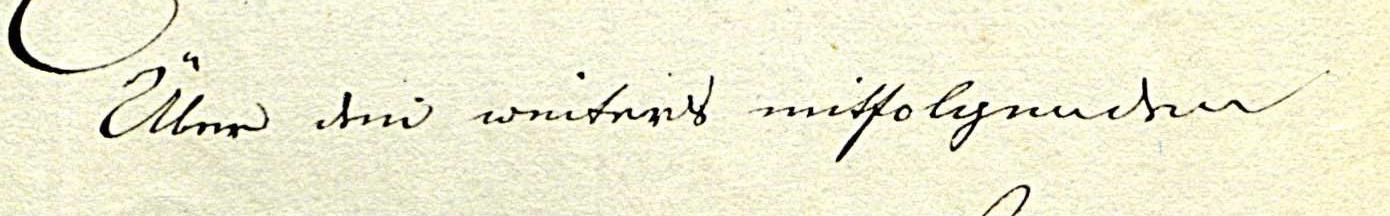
Über die weiters mitfolgenden
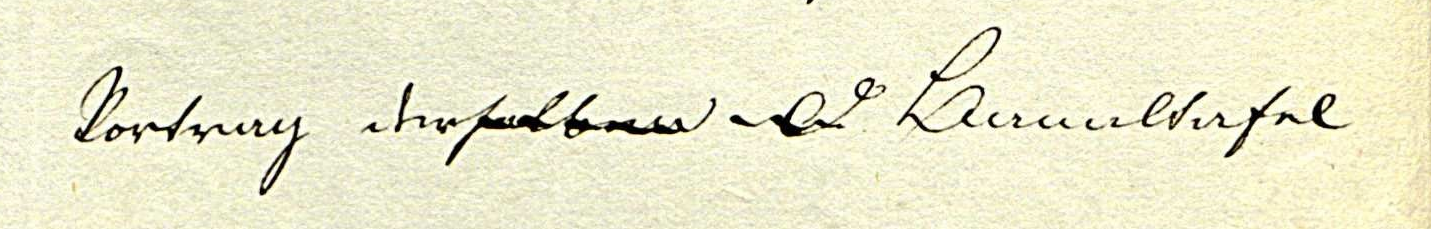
Vortrag der xx Banaltafel
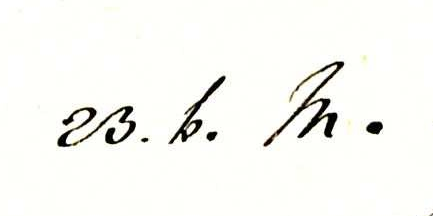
23. k. M.
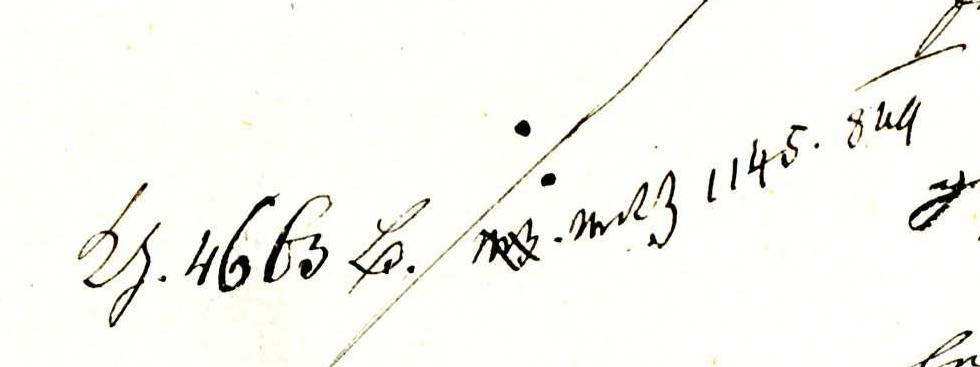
xx 4663 B. ./. M.R.Z. 1145. 849
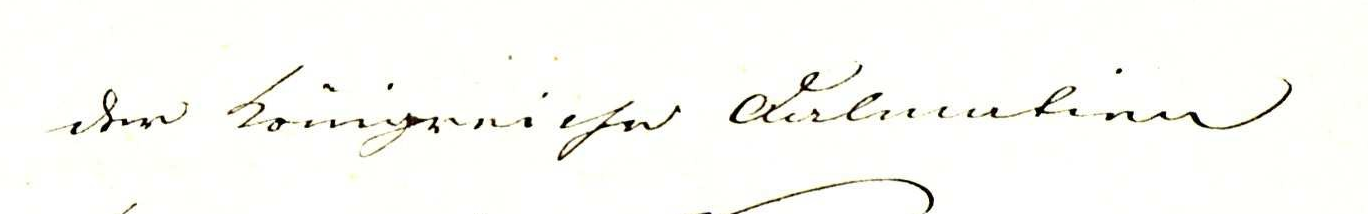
der Königreiche Dalmatien
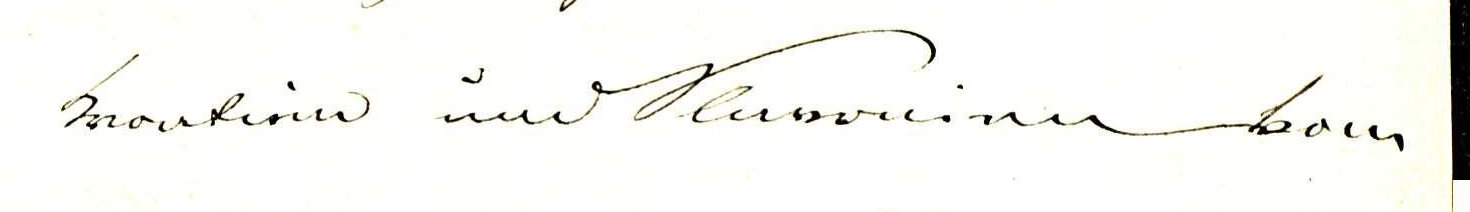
Kroatien und Slavorien vom
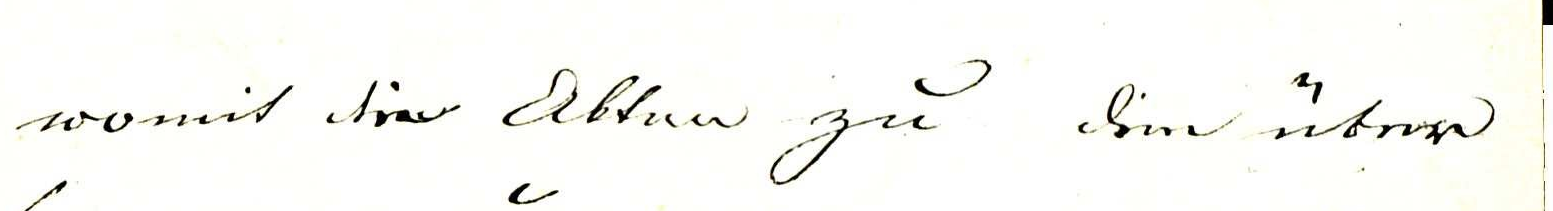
womit die Akten zu dem über
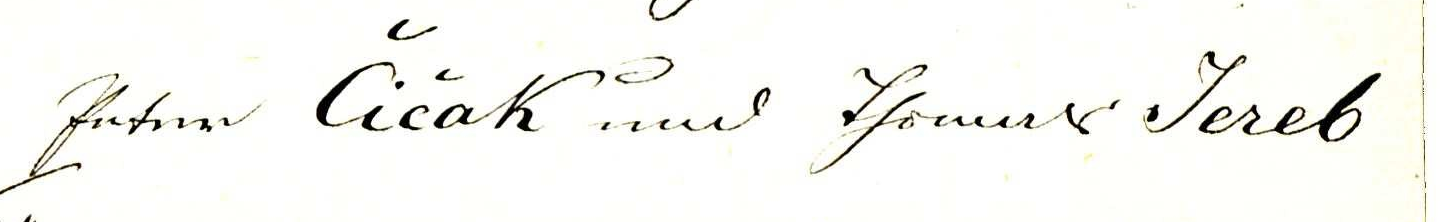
Peter Cicak und Thomas Jereb
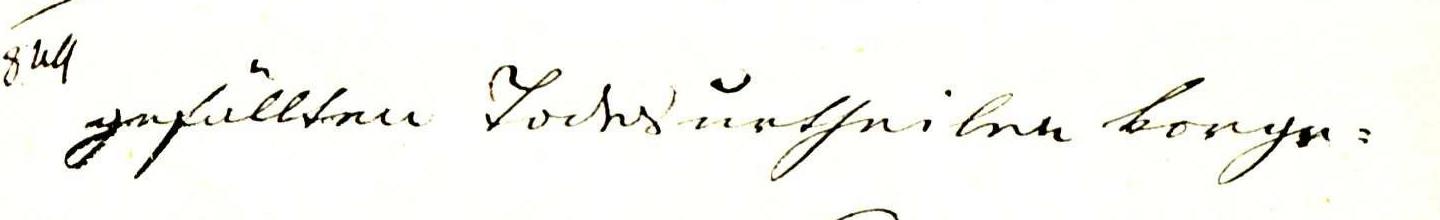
gefällten Todesurtheilen vorge¬
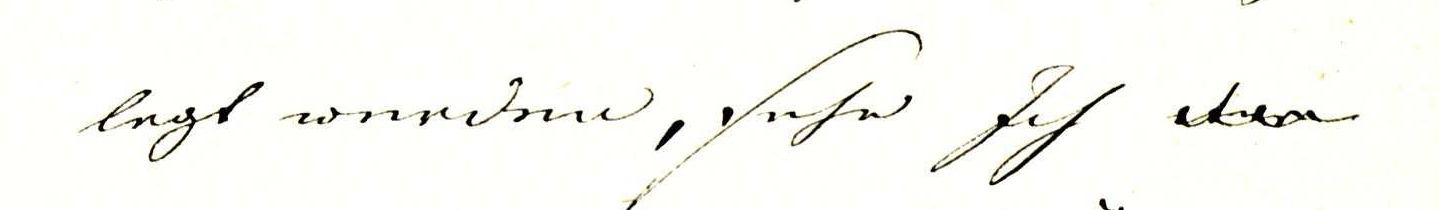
legt werden, sehe Jch
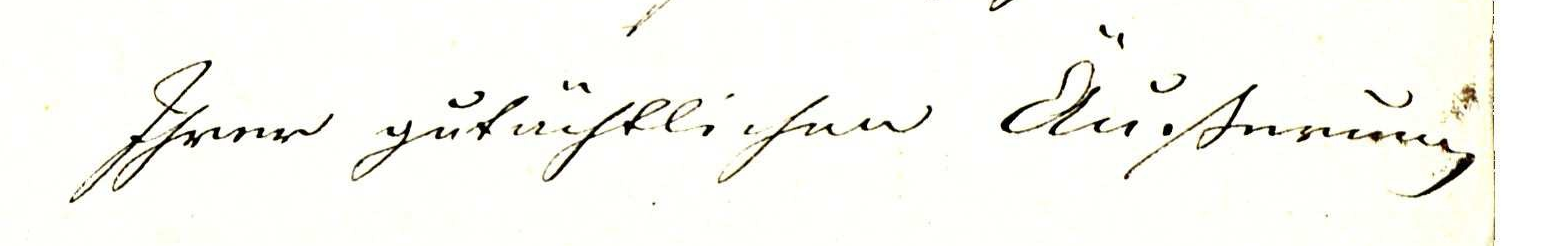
Jhrer gutächtlichen Äußerung
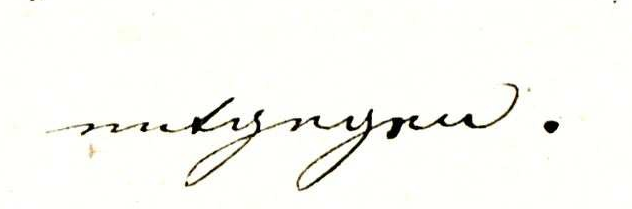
entgegen.
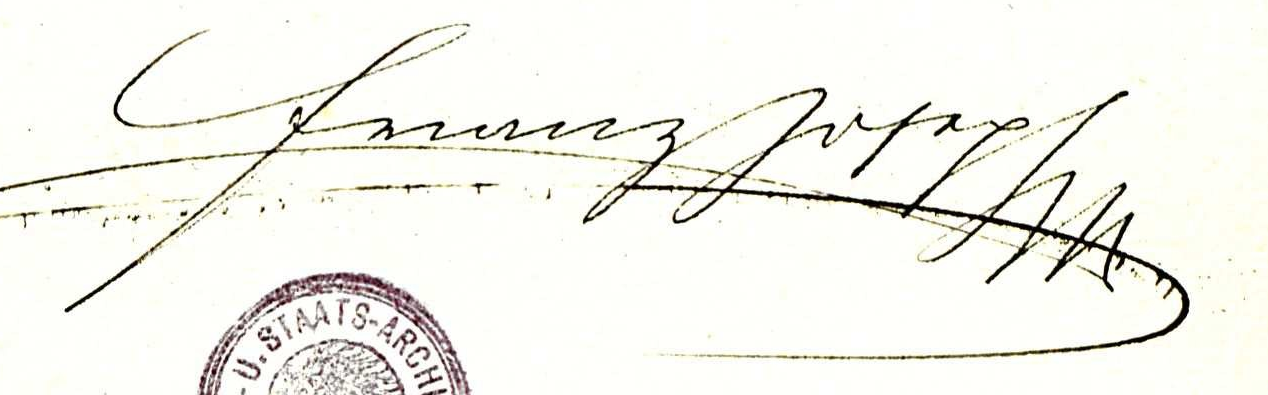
Franz Joseph
